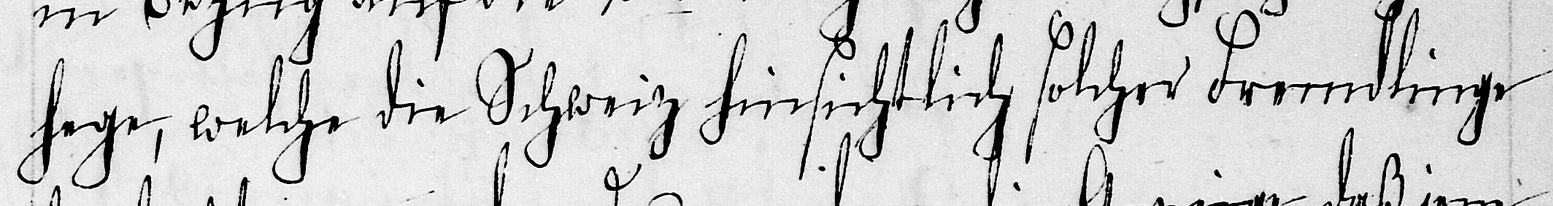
hege, welche die Schweiz hinsichtlich solcher Fremdlinge
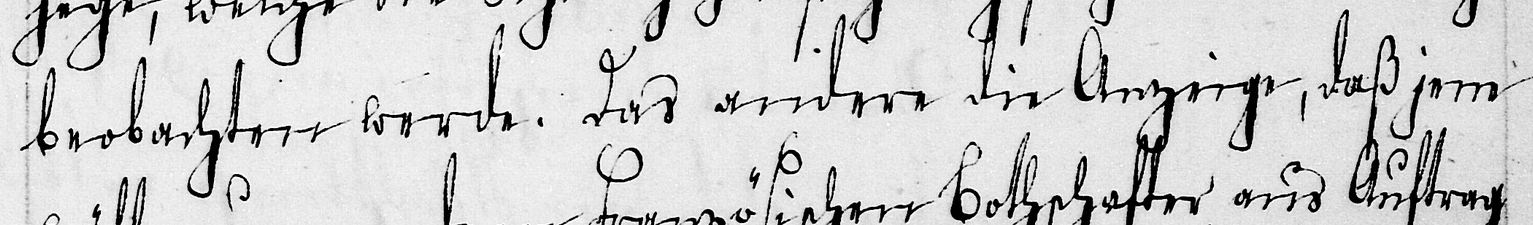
beobachten werde. Das andere die Anzeige, daß jene
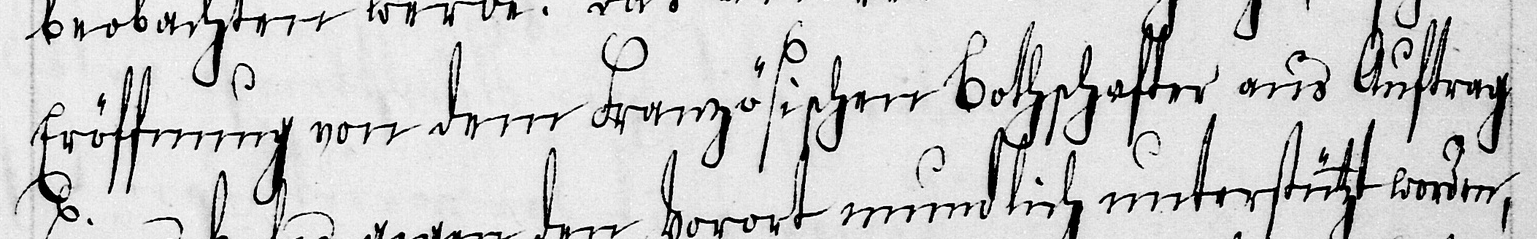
Eröffnung von dem Französischen Bothschafter aus Auftrag
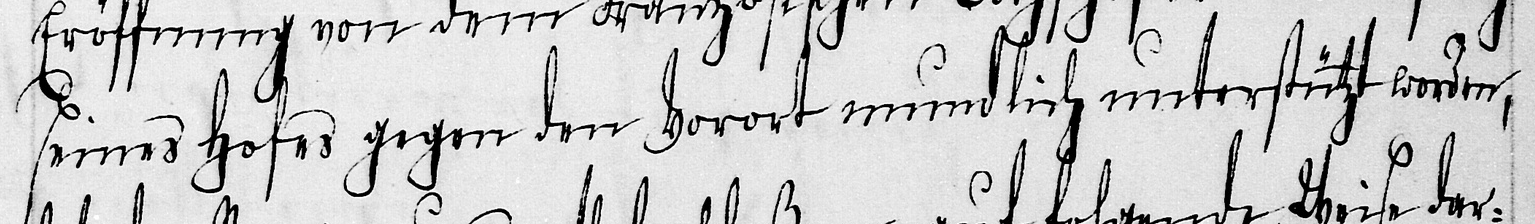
seines Hofes gegen den Vorort mundlich unterstützt worden,
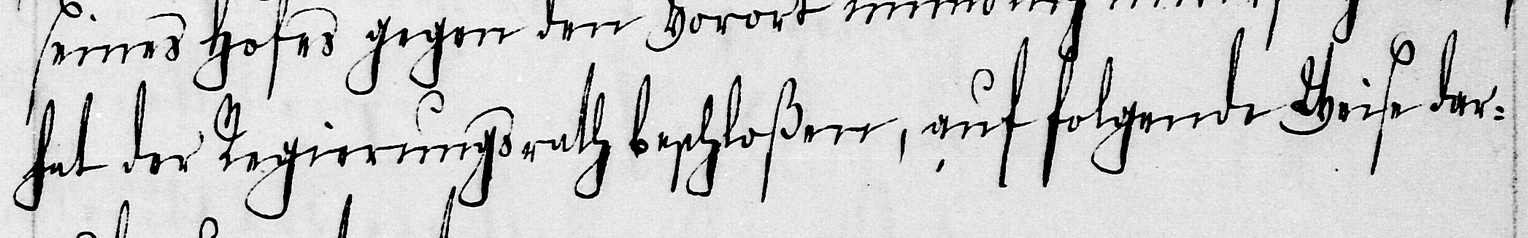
hat der Regierungsrath beschloßen, auf folgende Weise dar¬
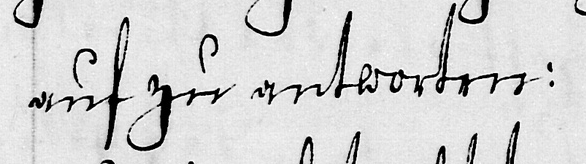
auf zu antworten:
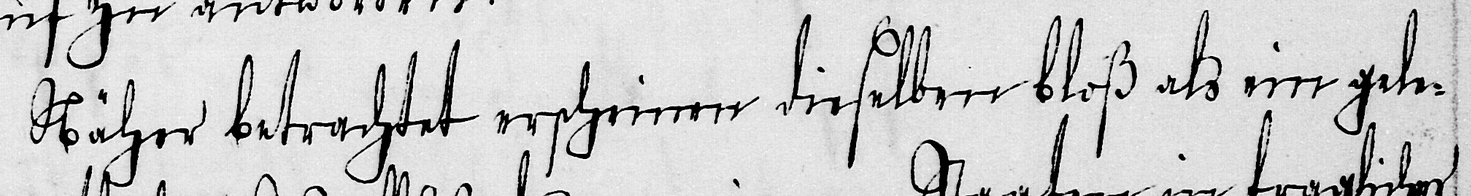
Näher betrachtet erscheinen dieselben bloß als ein gele¬
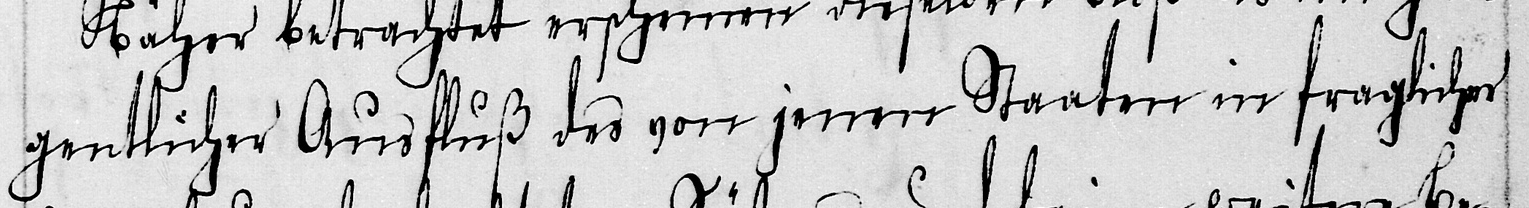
gentlicher Ausfluß des von jenen Staaten in fraglicher
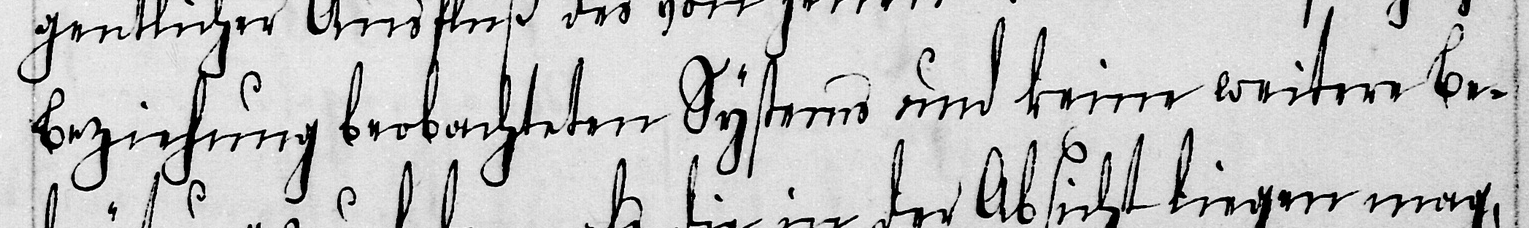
Beziehung beobachteten Systems und keine weitere Be¬
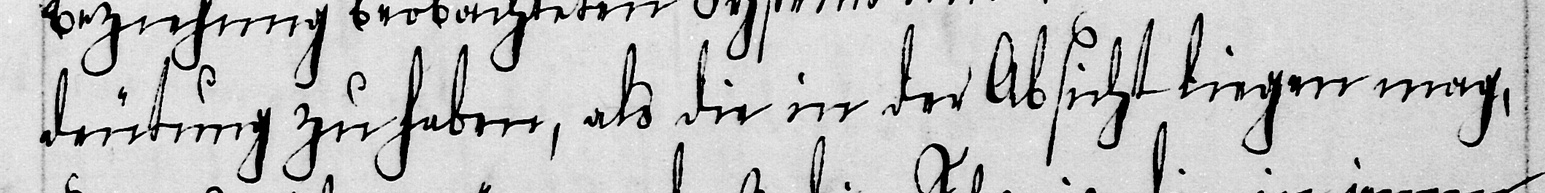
deutung zu haben, als die in der Absicht liegen mag,
